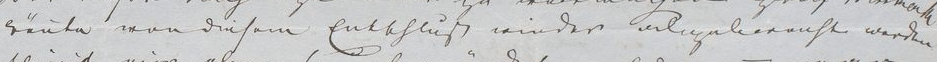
könnte von diesem Entschluß wieder abgebracht werden
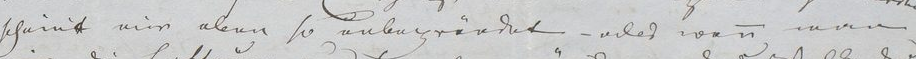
scheint mir eben so unbegründet, als wenn man
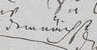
demnächst
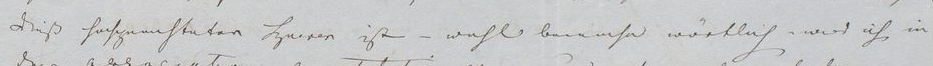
Dieß hochgeachteter Herr ist, wohl beinahe wörtlich, was ich in
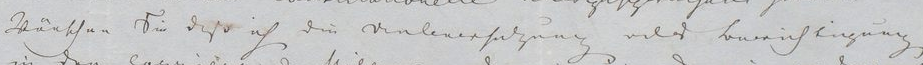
Wünschen Sie daß ich die Uebersetzung als Berichtigung
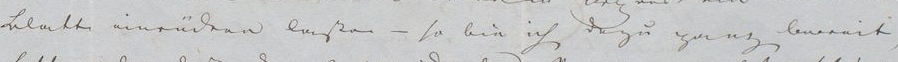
Blatt einrüken laße, so bin ich dazu ganz bereit,
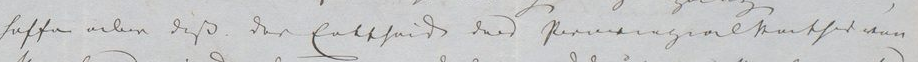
hoffe aber daß der Entscheid des ProvinzialRaths von
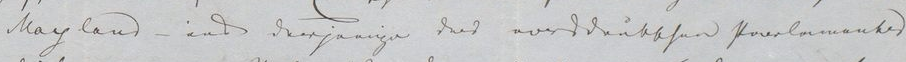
Mayland, und derjenige des nordeutschen Parlaments
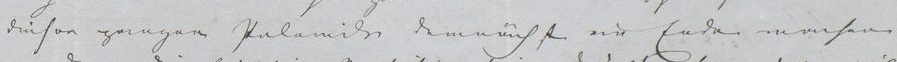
dieser ganzen Polemik demnächst ein Ende machen
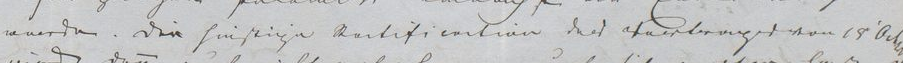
werde. Die hießige Ratification des Vertrags vom 15 Oct
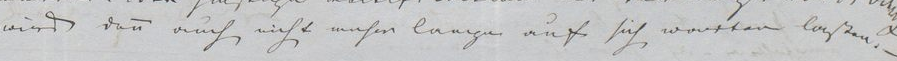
wird dann auch nicht mehr lange auf sich warten laßen. –
